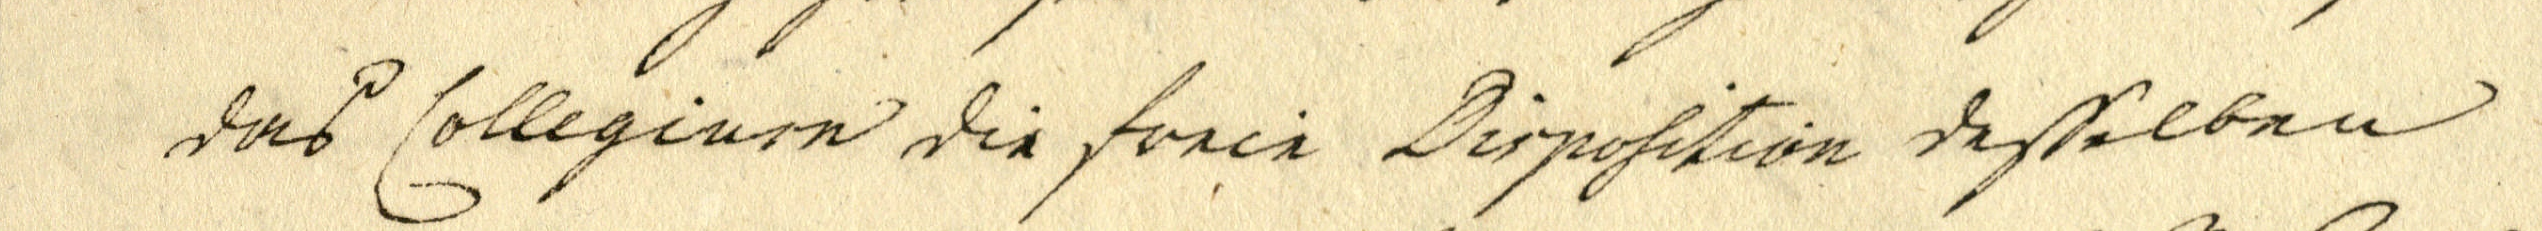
das Collegium die freie Disposition desselben
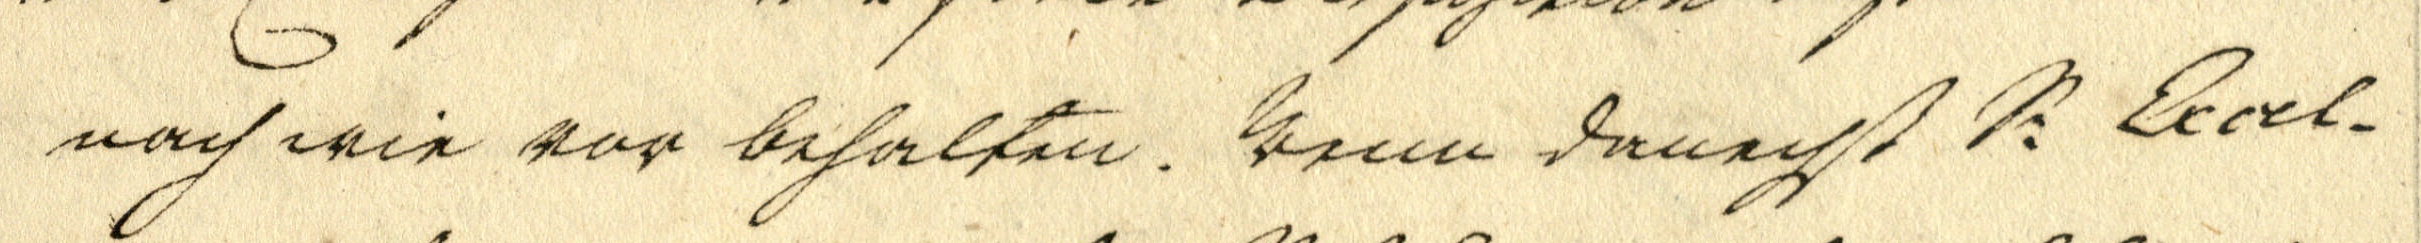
nach wie vor behalten. Wenn danechst Sr. Excel¬
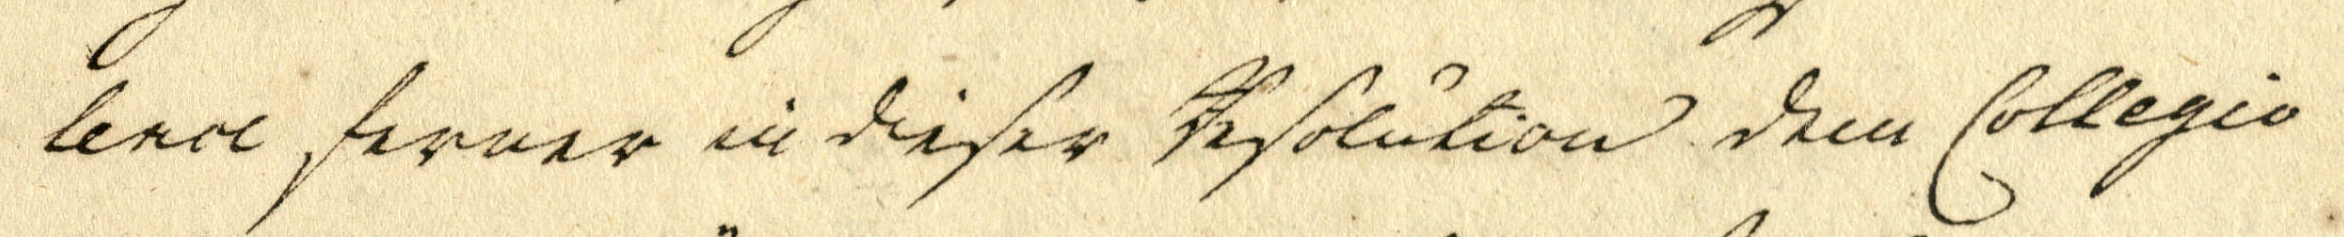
lence ferner in dieser Resolution dem Collegio
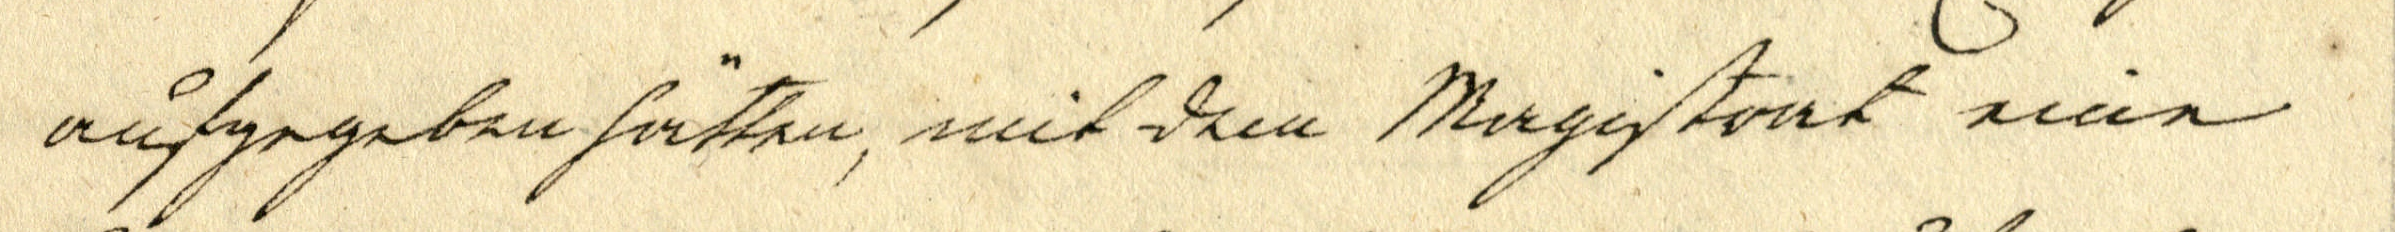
aufgegeben hätten, mit dem Magistrat eine
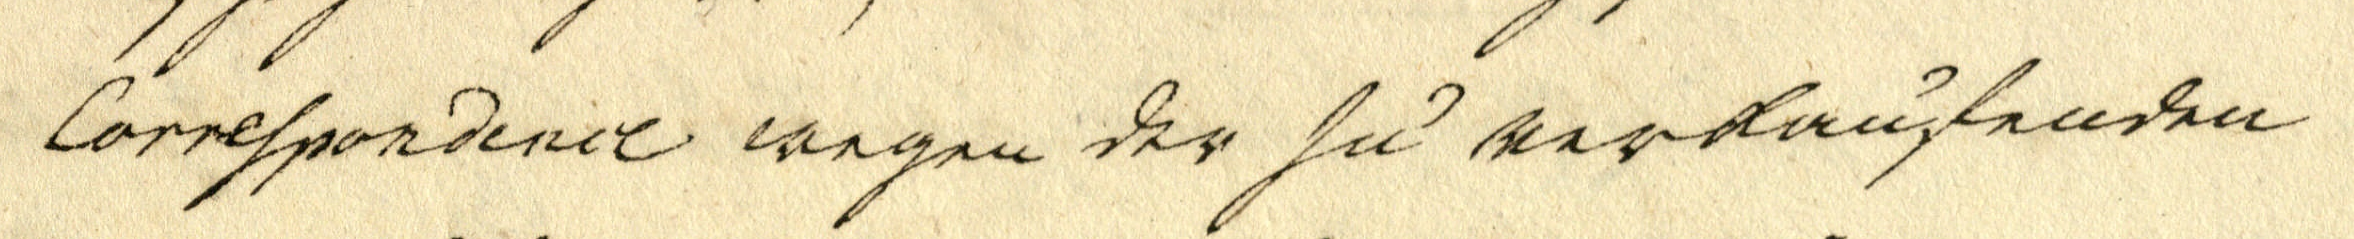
Correspondence wegen der zu verkaufenden
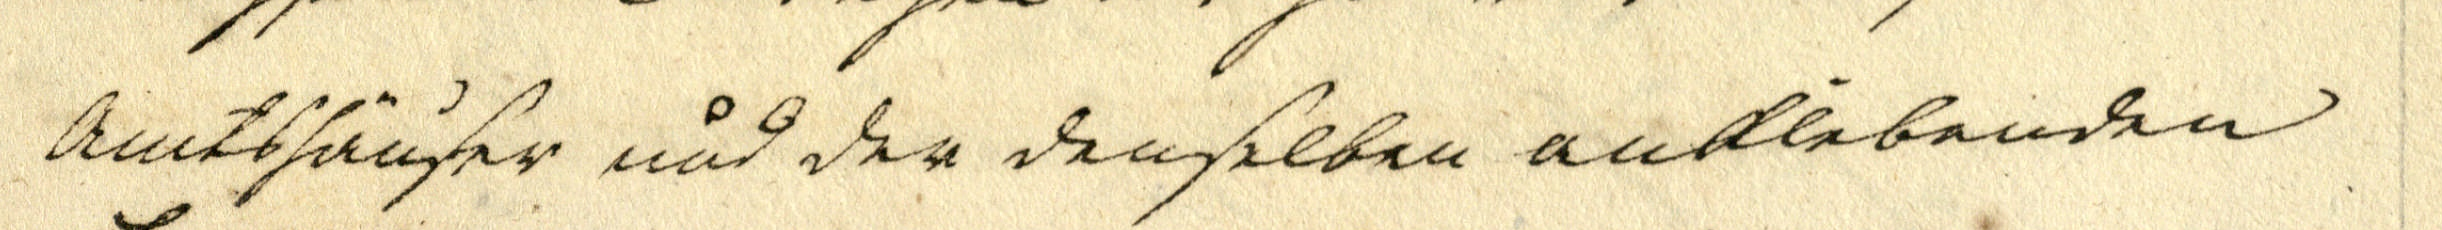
Amtshäuser und der denselben anklebenden
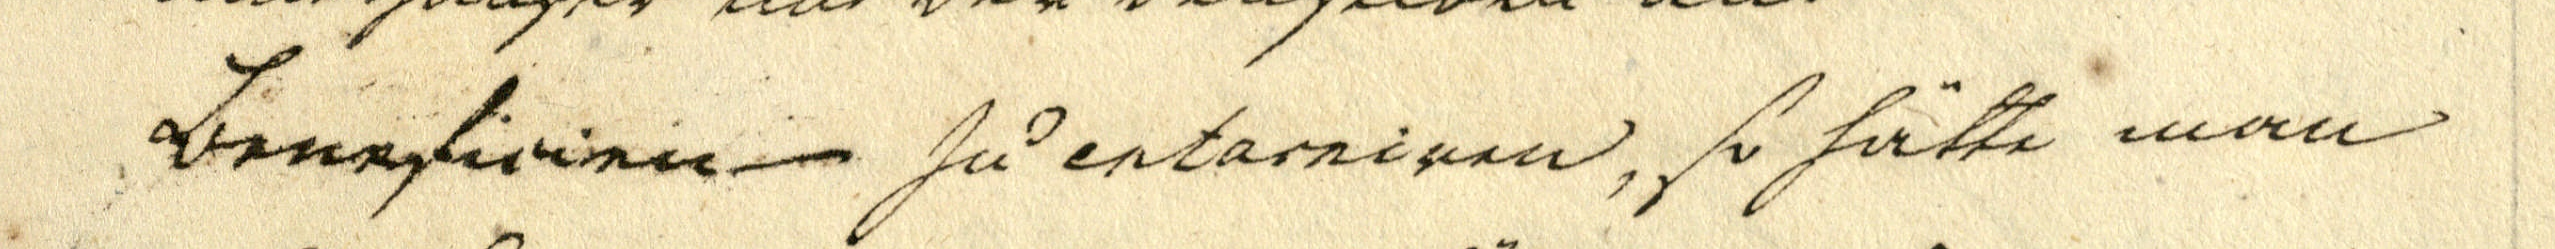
Beneficien zu entarniren, so hätte man
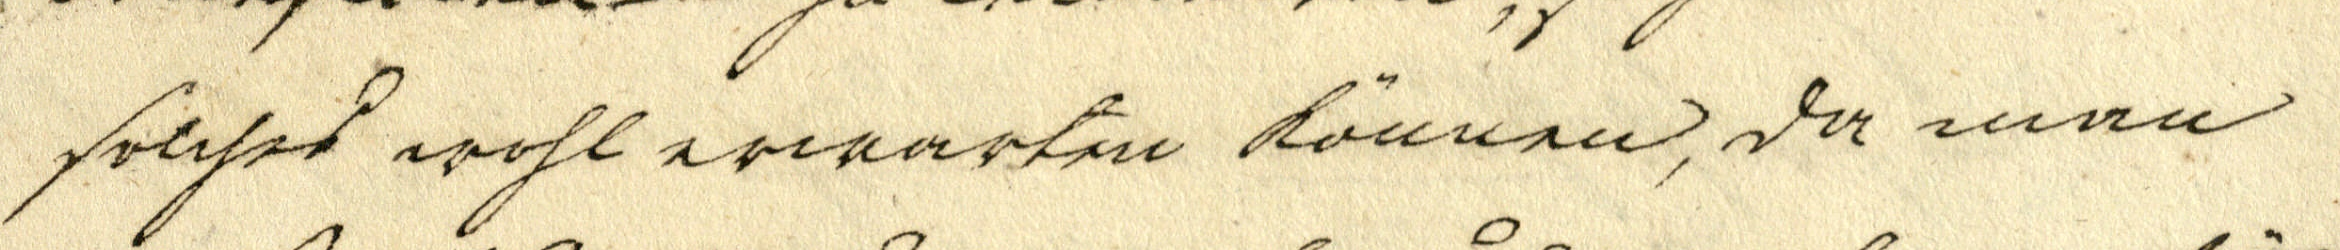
solches wohl erwarten können, da man
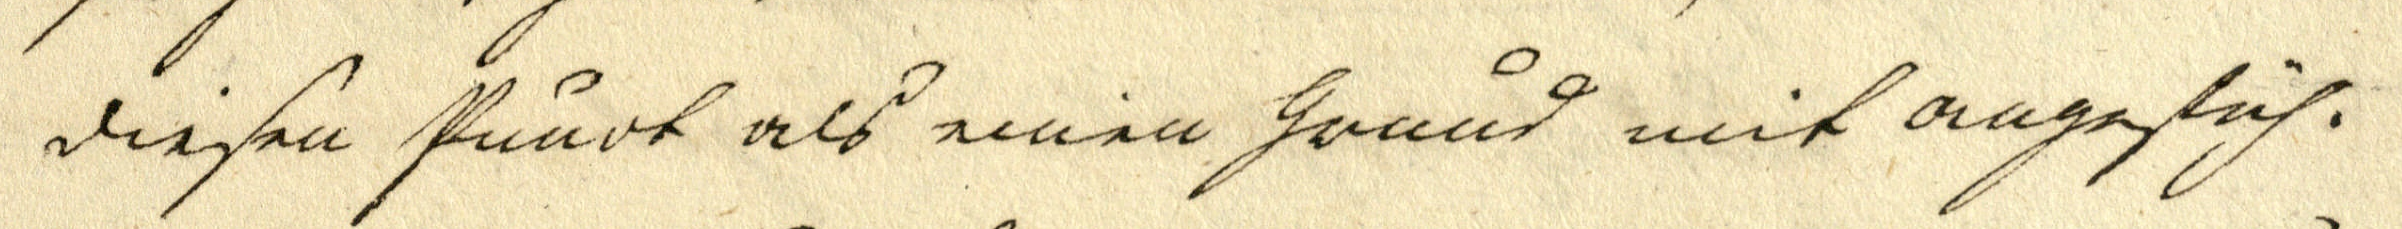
diesen Punct als einen Grund mit angefüh¬
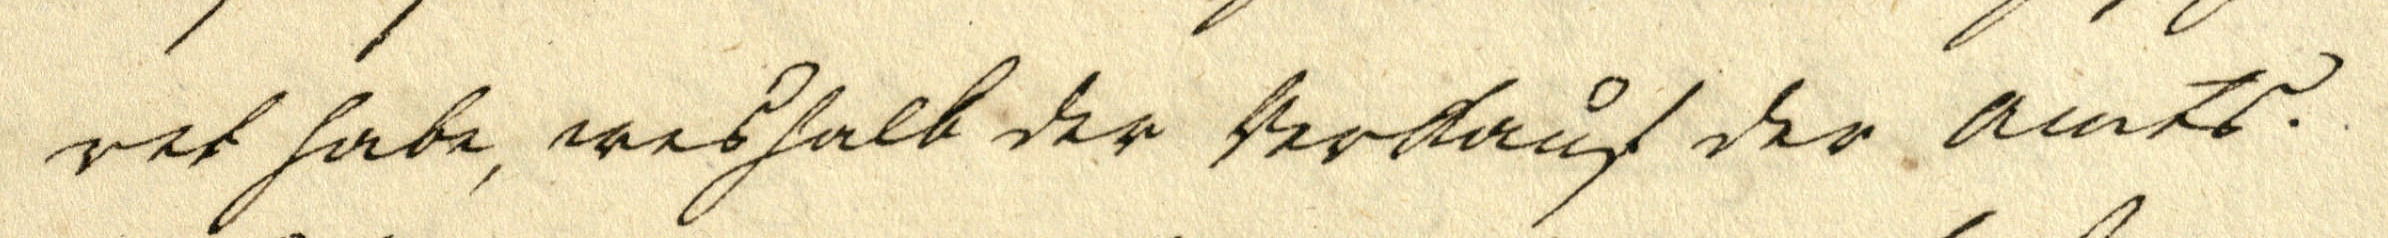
ret habe, weshalb der Verkauf der Amts¬
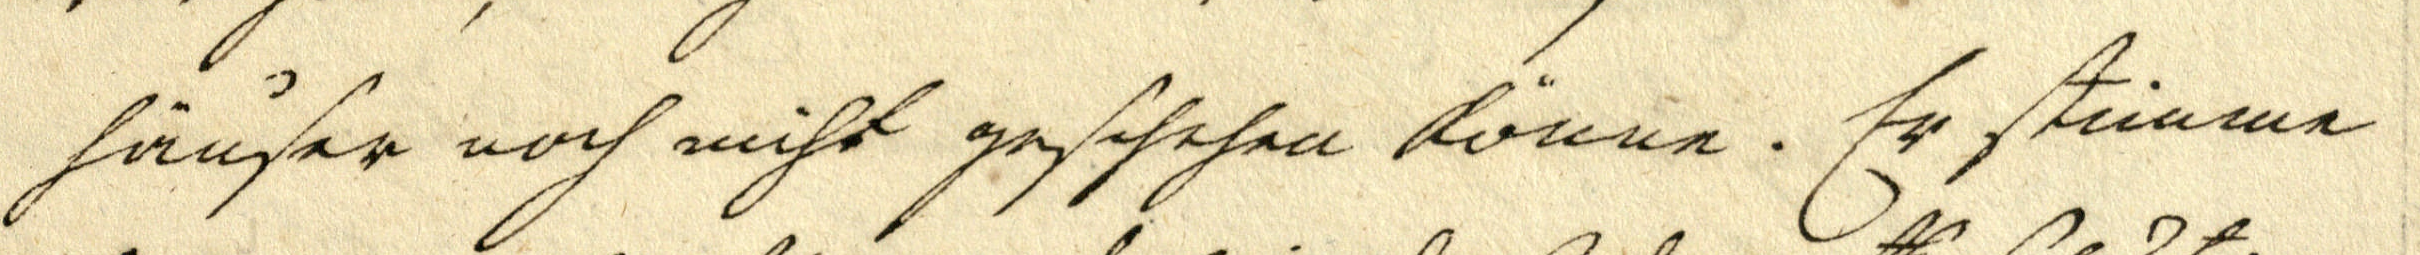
häuser noch nicht geschehen könne. Er stimme
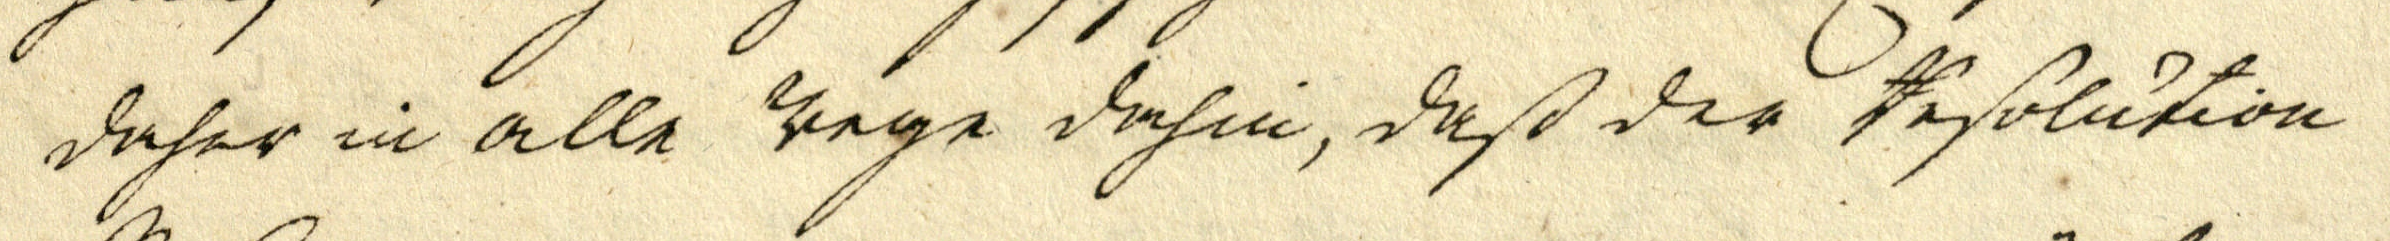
daher in alle Wege dahin, daß der Resolution
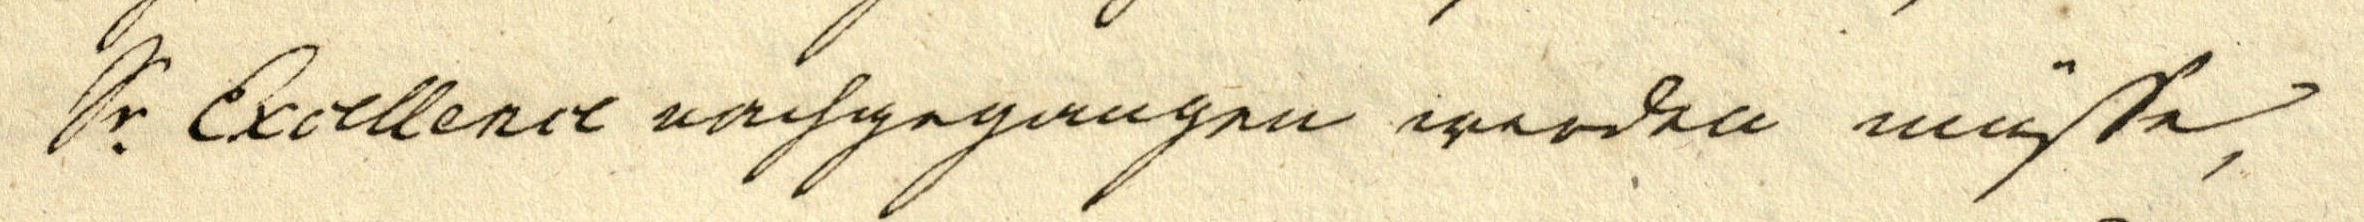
Sr. Excellence nachgegangen werden müsse,
